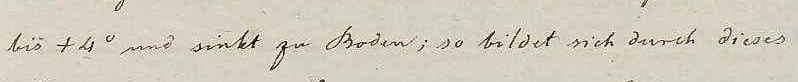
bis +4° und sinkt zu Boden; so bildet sich durch dieses
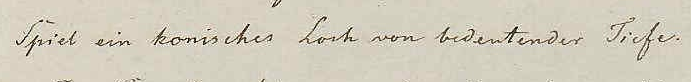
Spiel ein konisches Loch von bedeutender Tiefe.
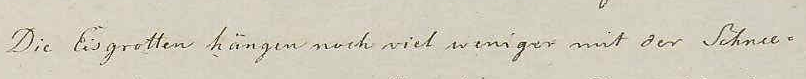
Die Eisgrotten hängen noch viel weniger mit der Schnee-
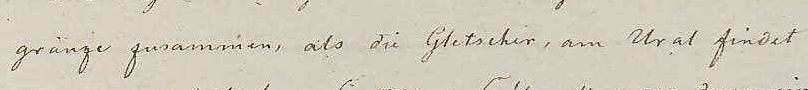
gränze zusammen, als die Gletscher, am Ural findet
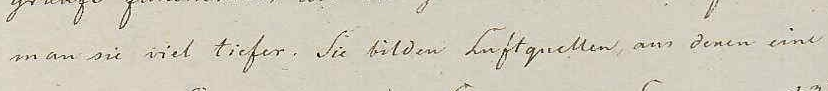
man sie viel tiefer. Sie bilden Luftquellen, aus denen eine
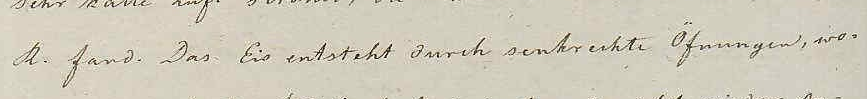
R. fand. Das Eis entsteht durch senkrechte Öfnungen, wo
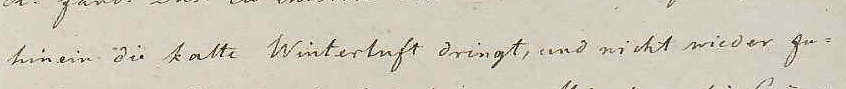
hinein die kalte Winterluft dringt, und nicht wieder zu-
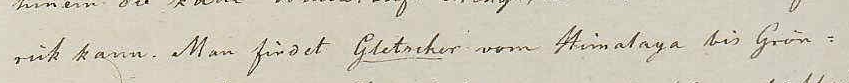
rük kann. Man findet Gletscher vom Himalaya bis Grön-
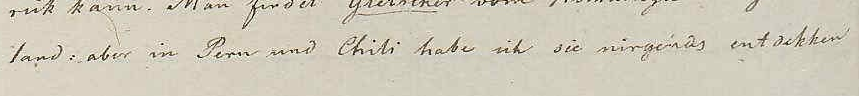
land: aber in Peru und Chili habe ich sie nirgends entdekken
